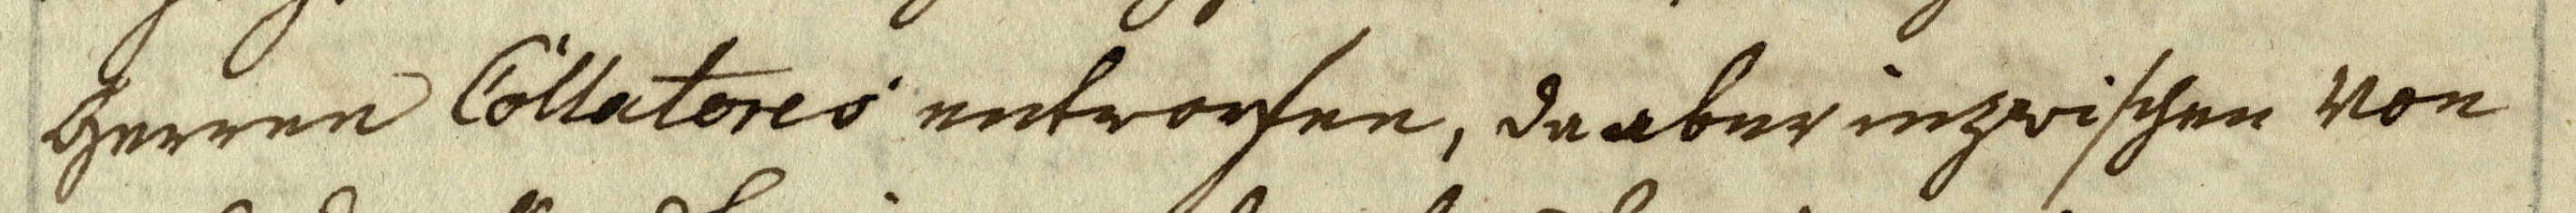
Herren Collatores entworfen, da aber inzwischen von
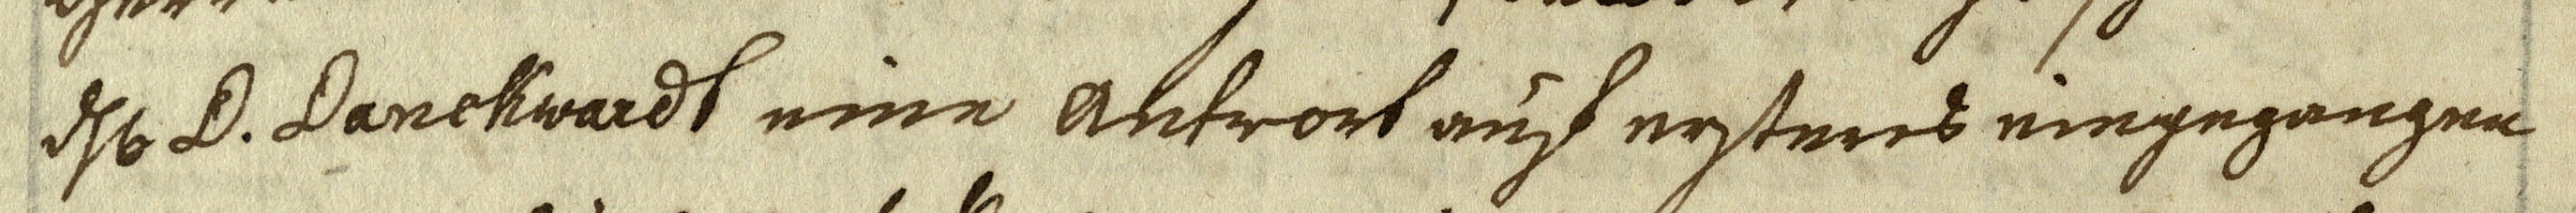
dh D. Danckwardt eine Antwort auf ersteres eingegangen
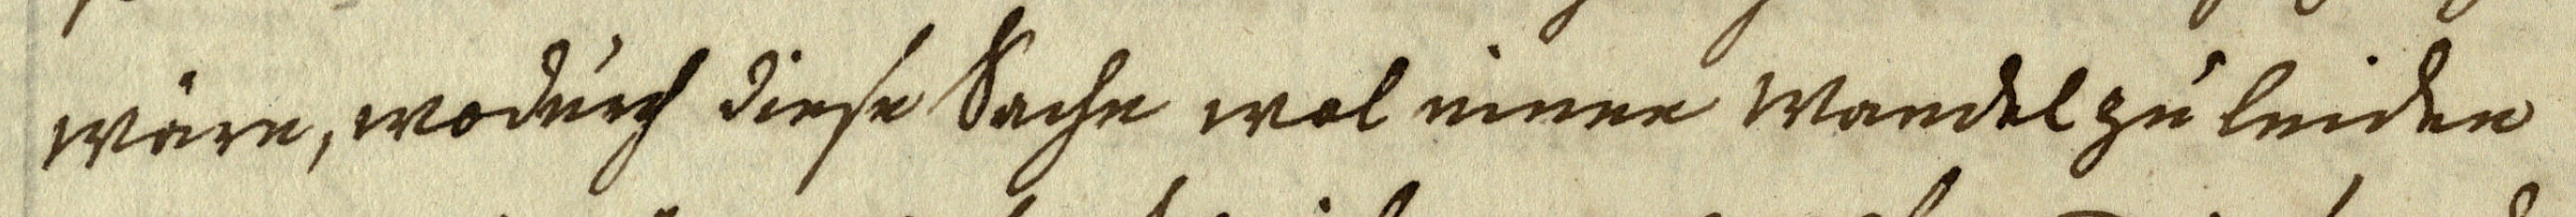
wäre, wodurch diese Sache wol einen Wandel zu leiden
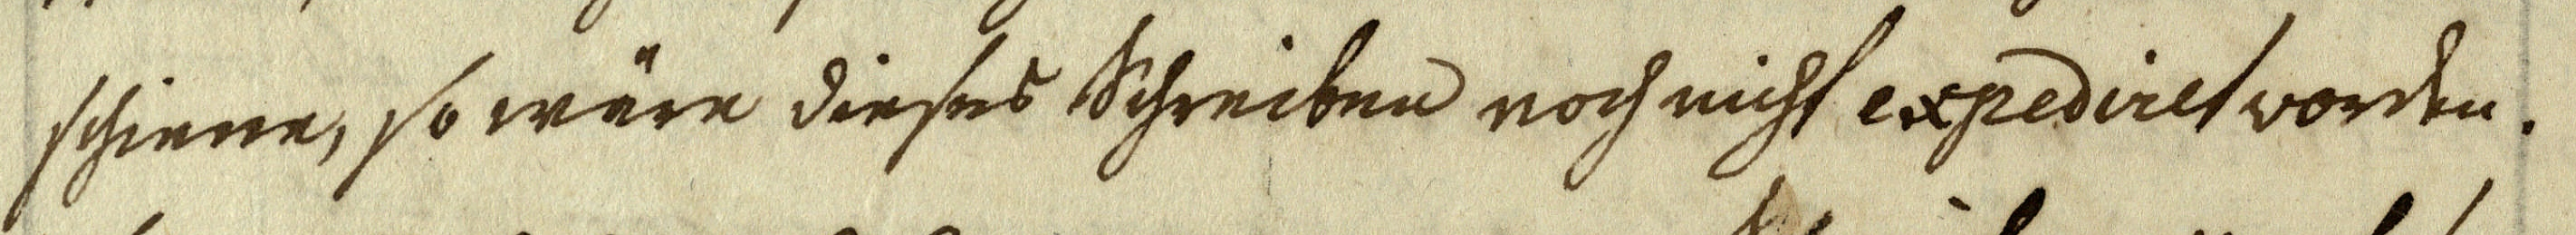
schiene, so wäre dieses Schreiben noch nicht expediret worden.
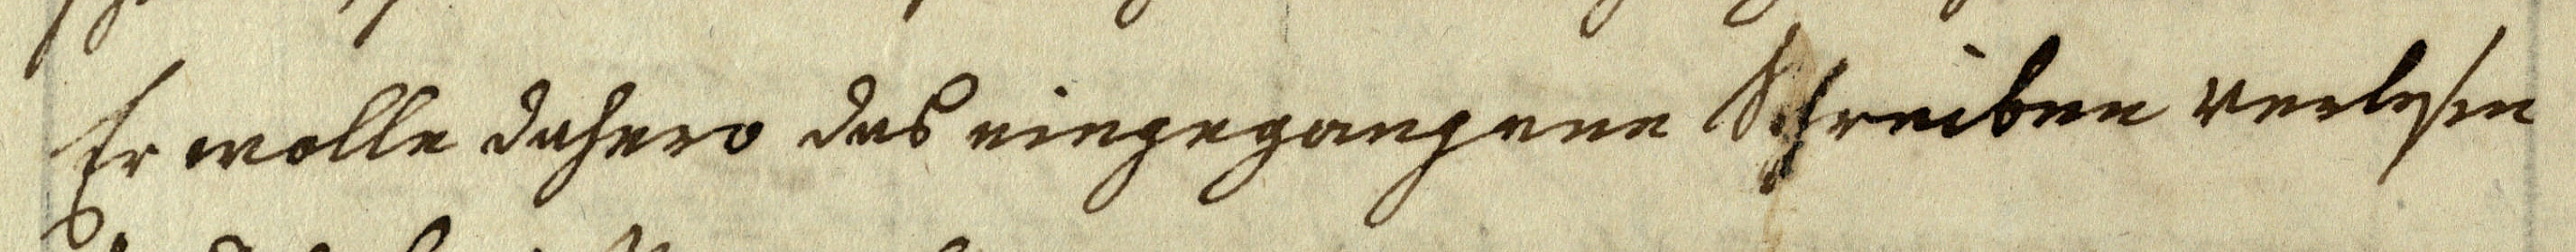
Er wolle dahero das eingegangene Schreiben verlesen
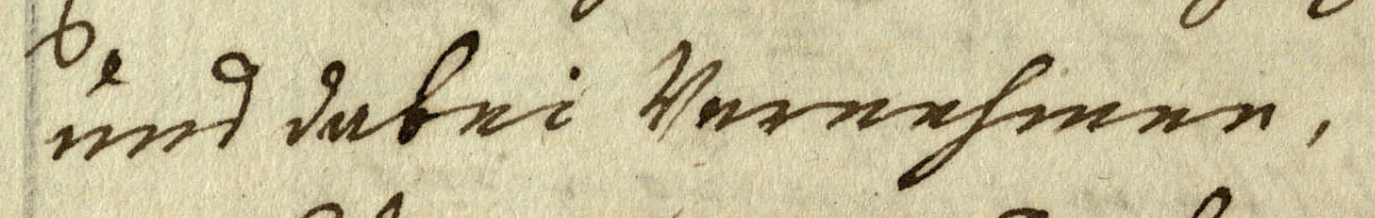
und dabei vernehmen,
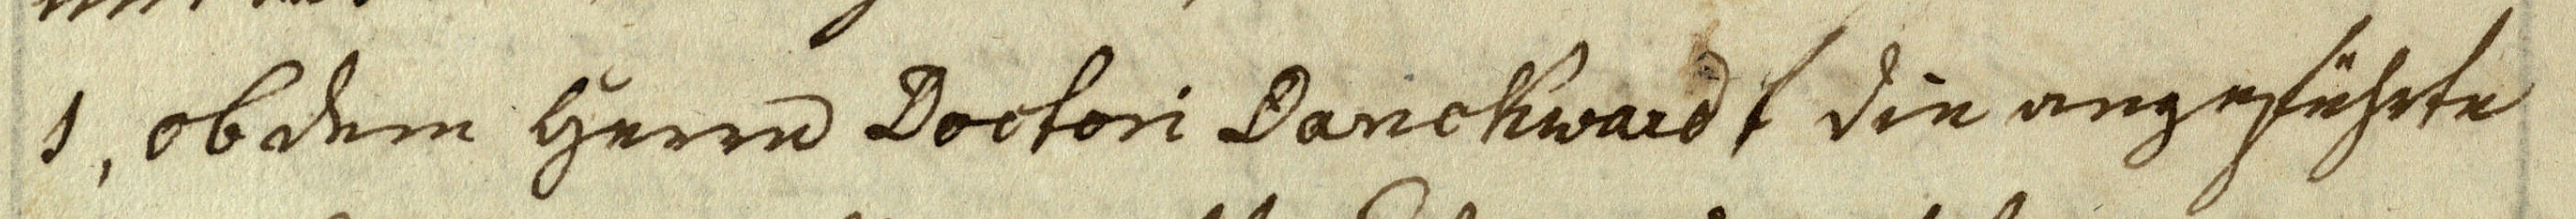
1, ob dem Herrn Doctori Danckwardt die angeführte
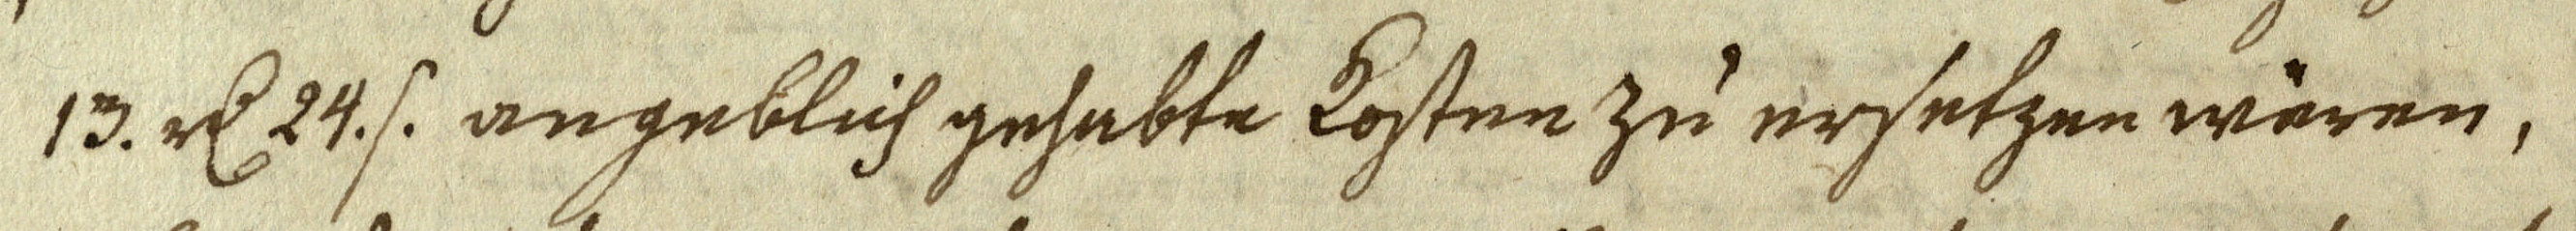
13 r. 24. s. angeblich gehabte Kosten zu ersetzen wären,
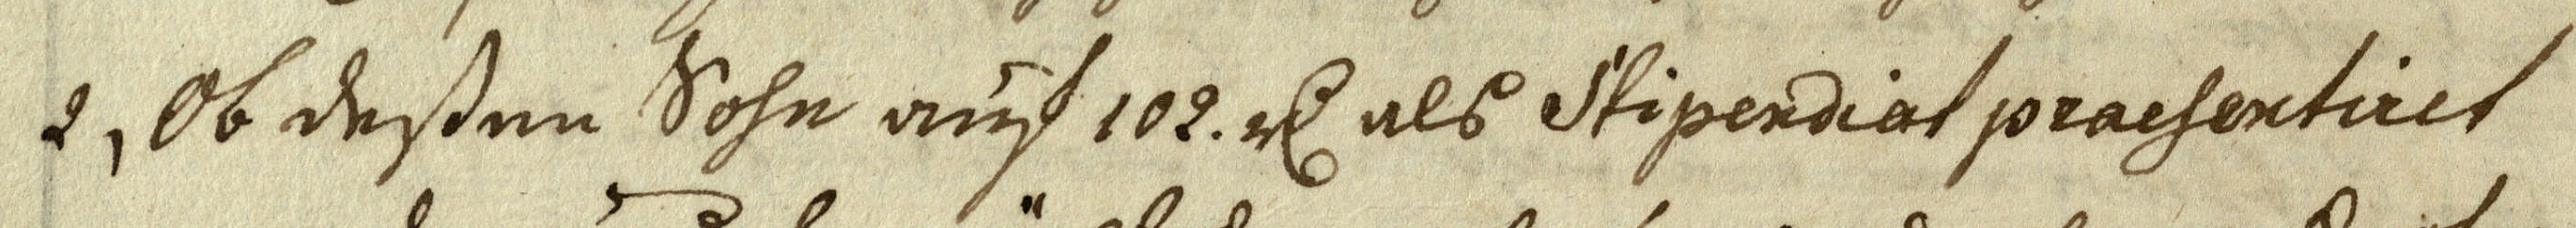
2, ob dessen Sohn auf 102. r. als Stipendiat praesentiret
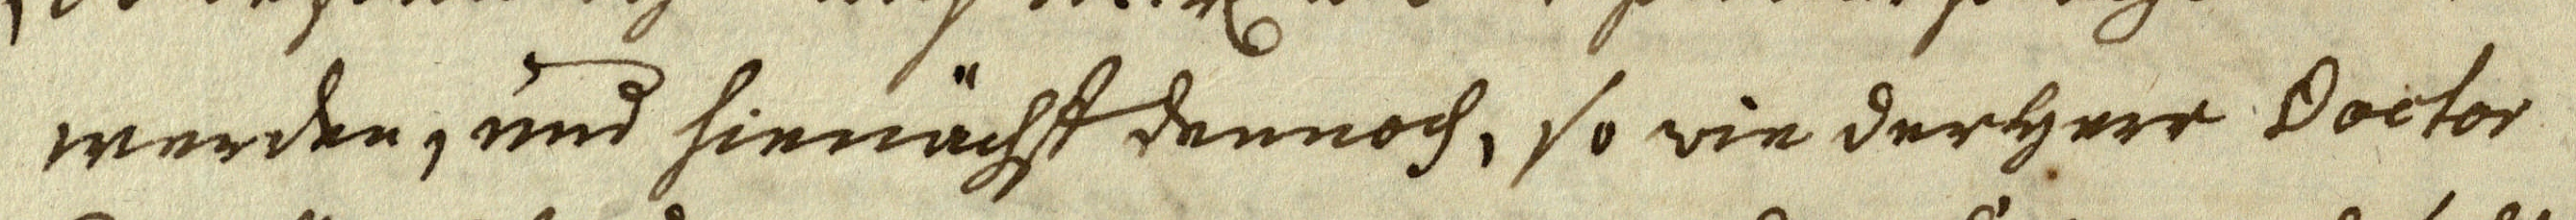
werde, und hienächst dennoch, so wie der Herr Doctor
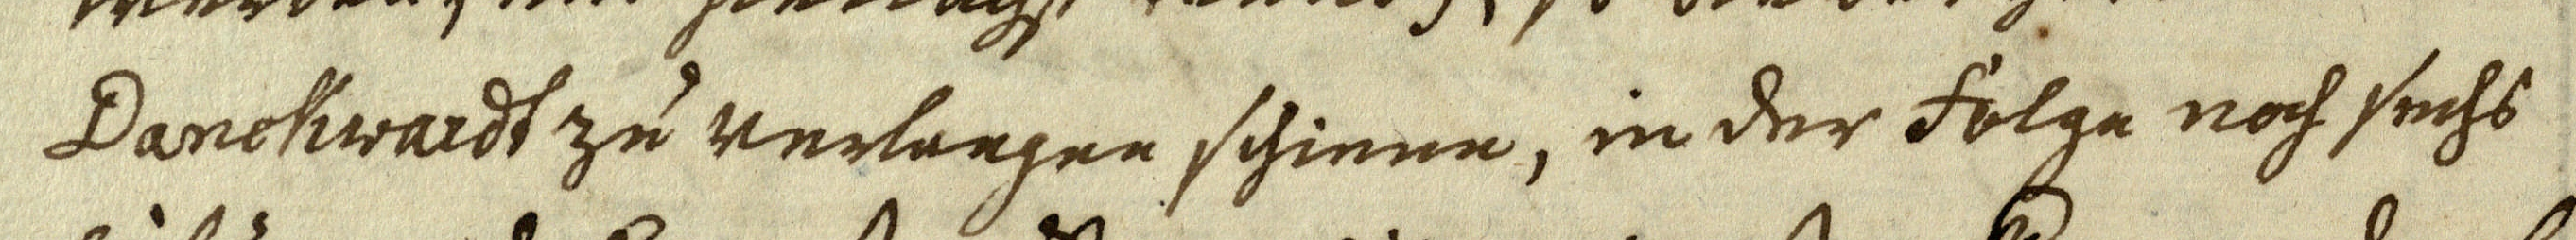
Danckwardt zu verlangen schiene, in der Folge noch sechs
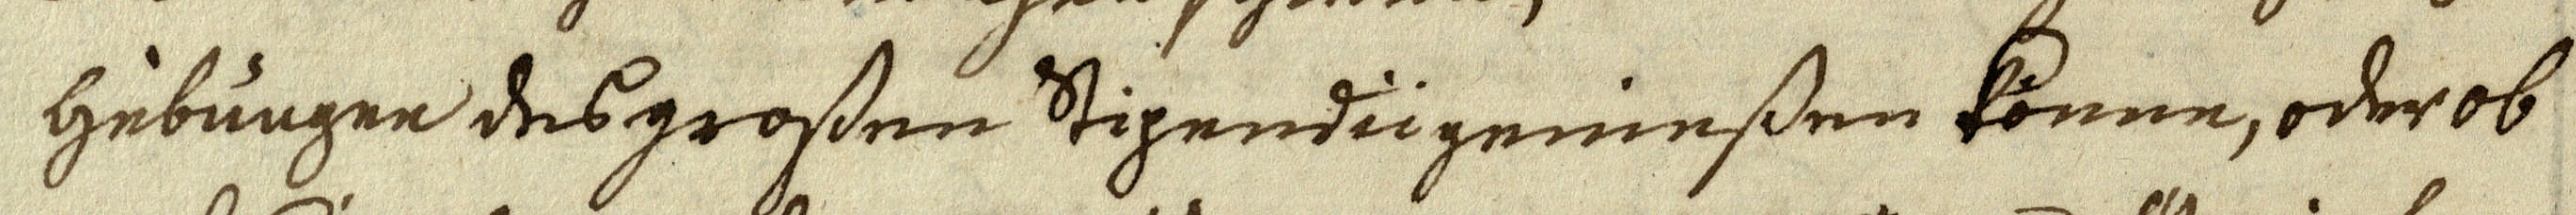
Hebungen des großen Stipendii genießen könne, oder ob
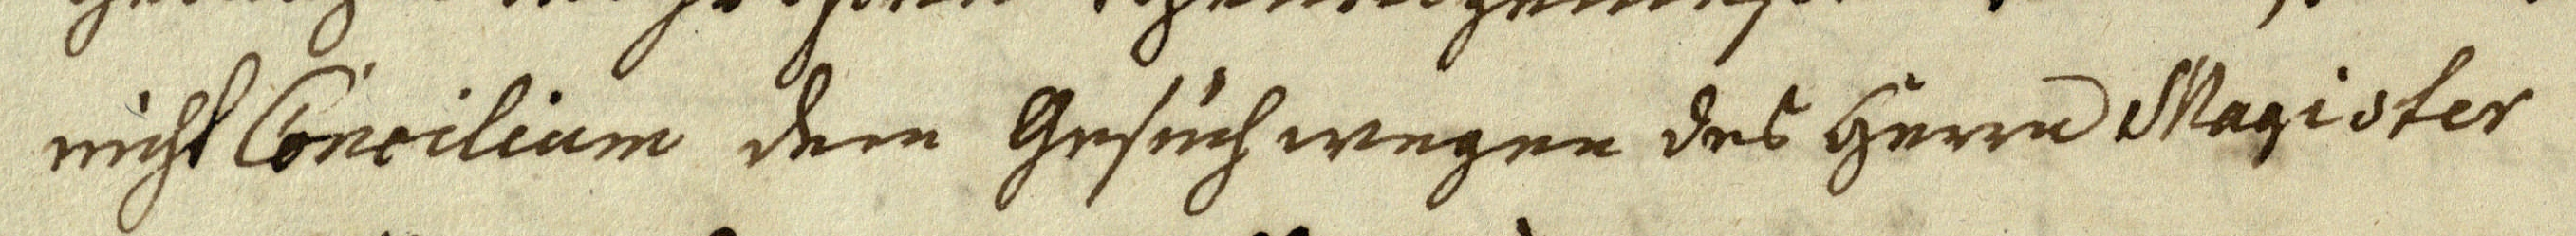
nicht Concilium dem Gesuch wegen des Herrn Magister
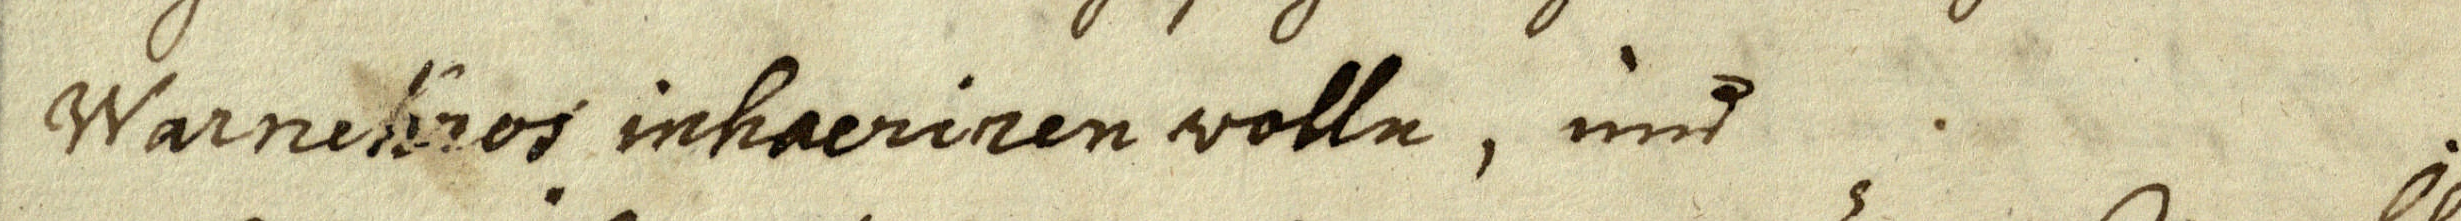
Warnekros inhaeriren wolle, und
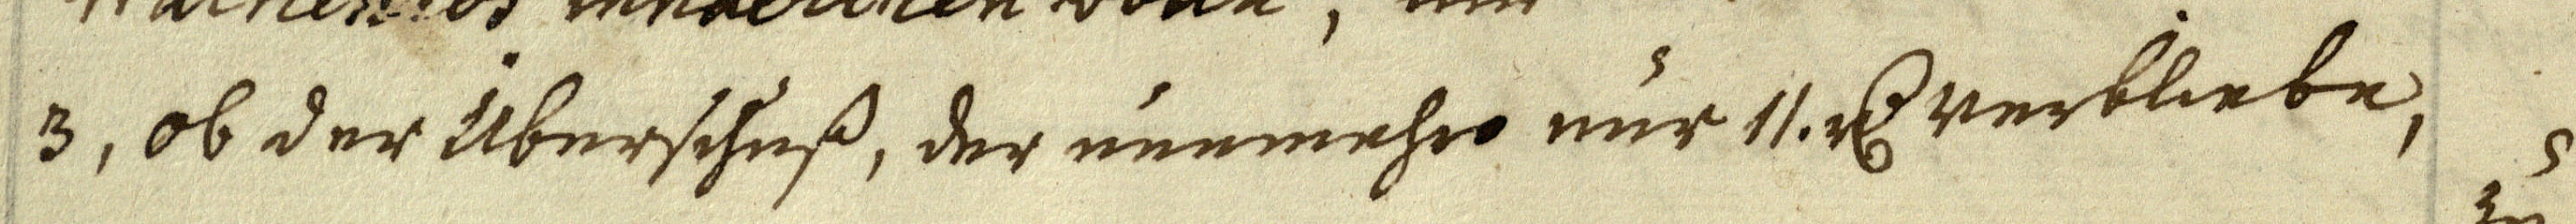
3, ob der Überschuß, der nunmehr nur 11. r. verbliebe,
